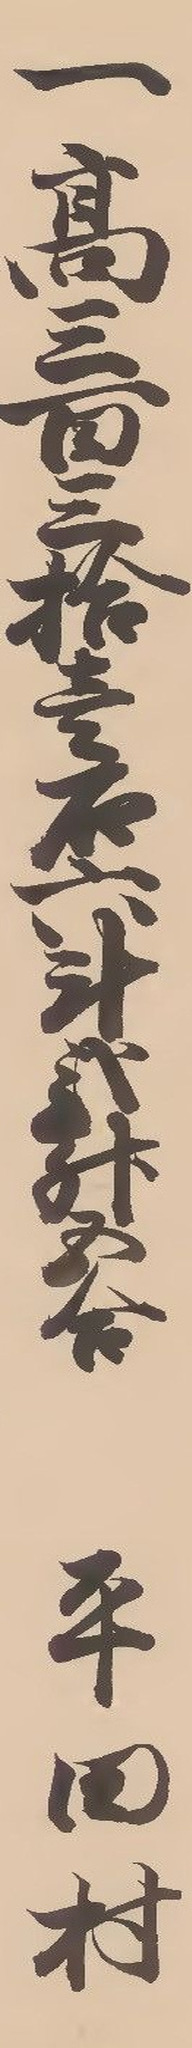一高三百三拾壱石六斗弐升五合平田村
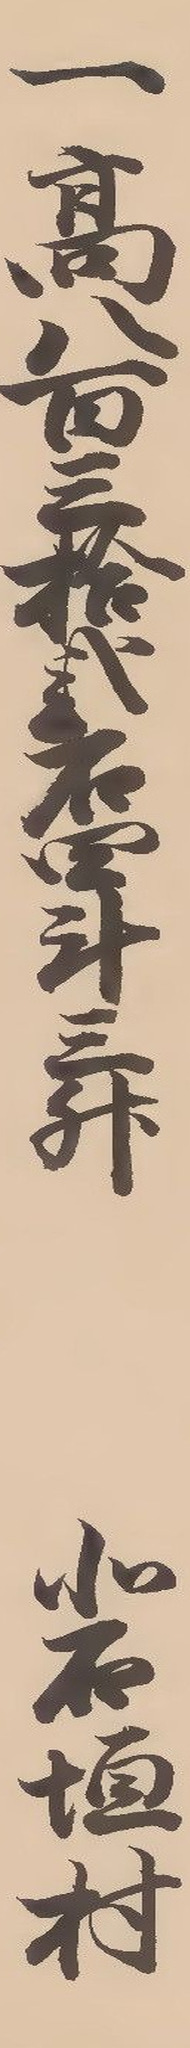一高八百三拾弐石四斗三升北石垣村
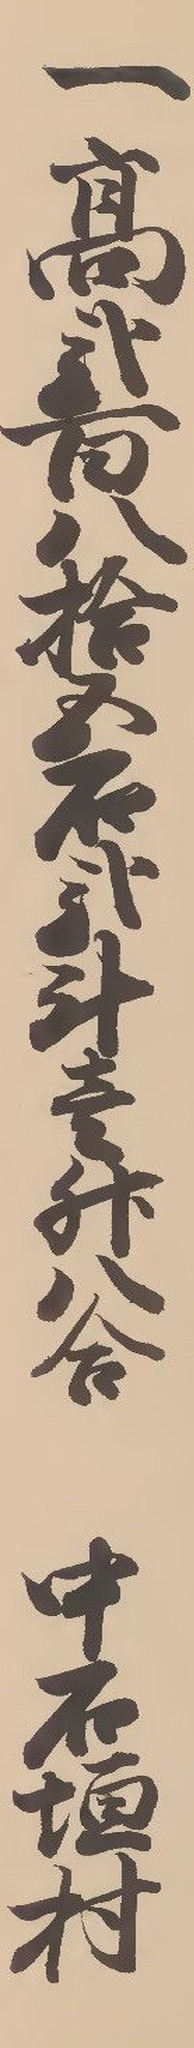一高弐百八拾五石弐斗壱升八合中石垣村
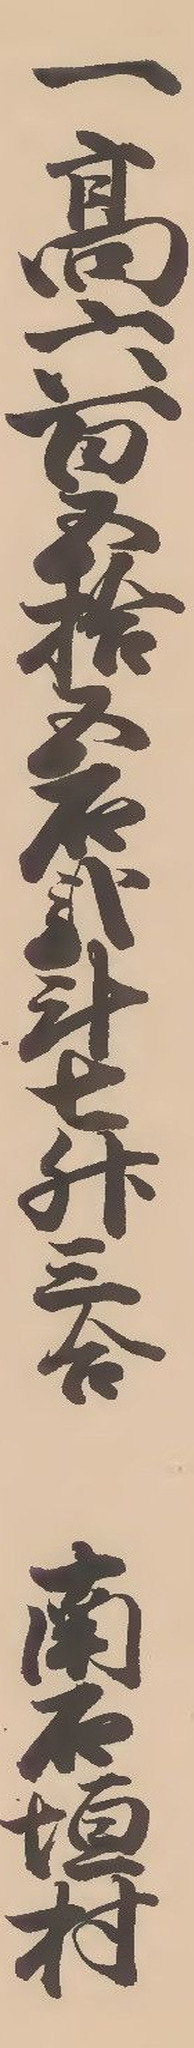一高六百五拾五石弐斗七升三合南石垣村
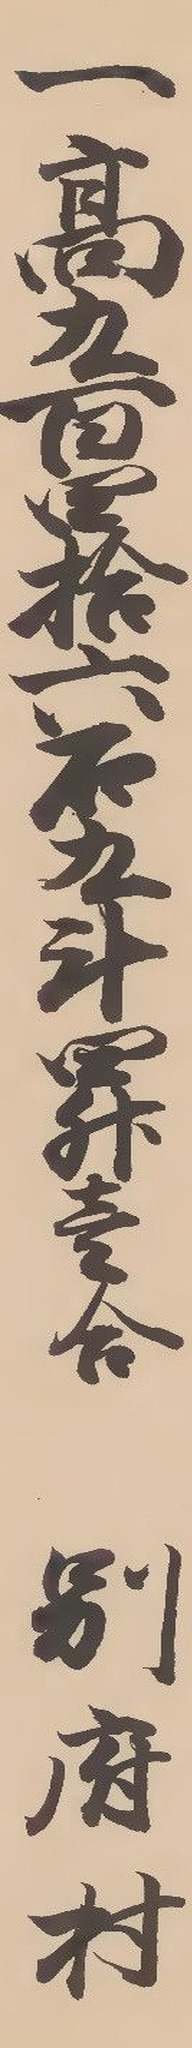一高九百四拾六石九斗四升壱合別府村
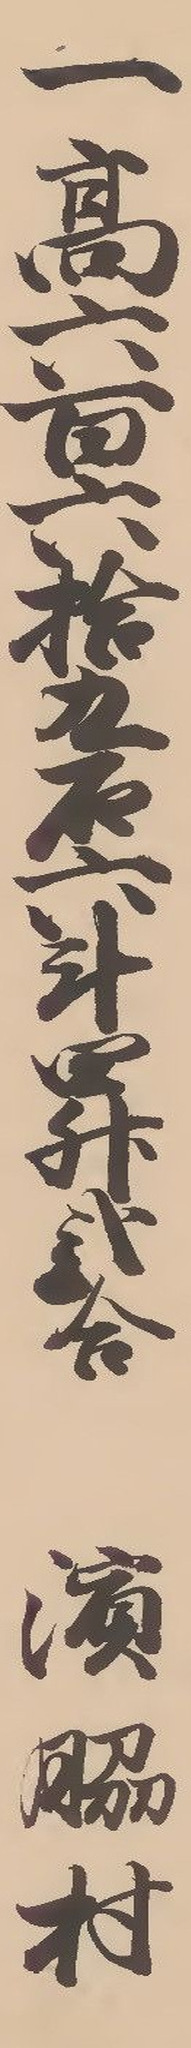一高六百六拾九石六斗四升弐合浜脇村

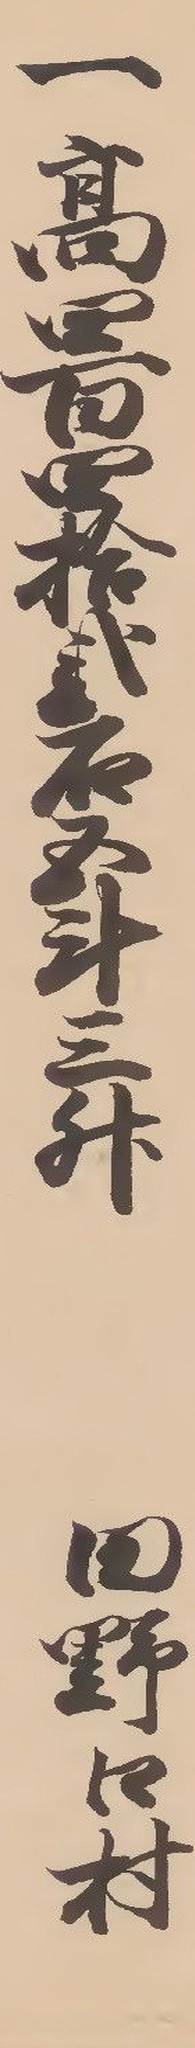一高四百四拾弐石五斗三升田野口村
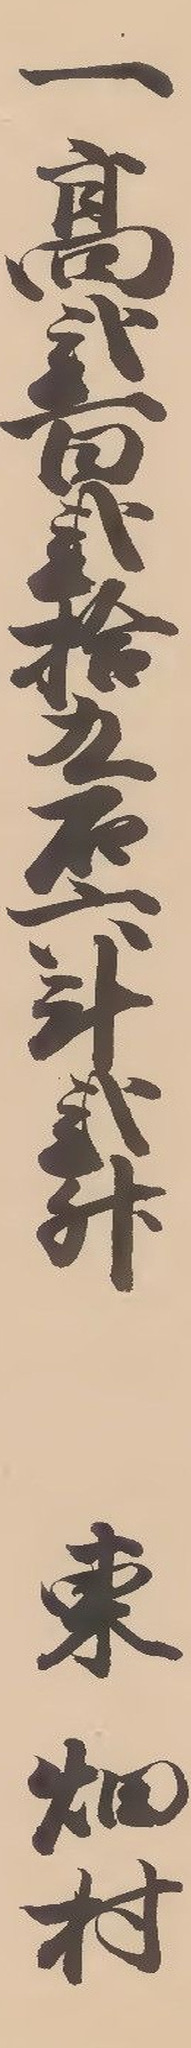一高弐百弐拾九石六斗弐升東畑村
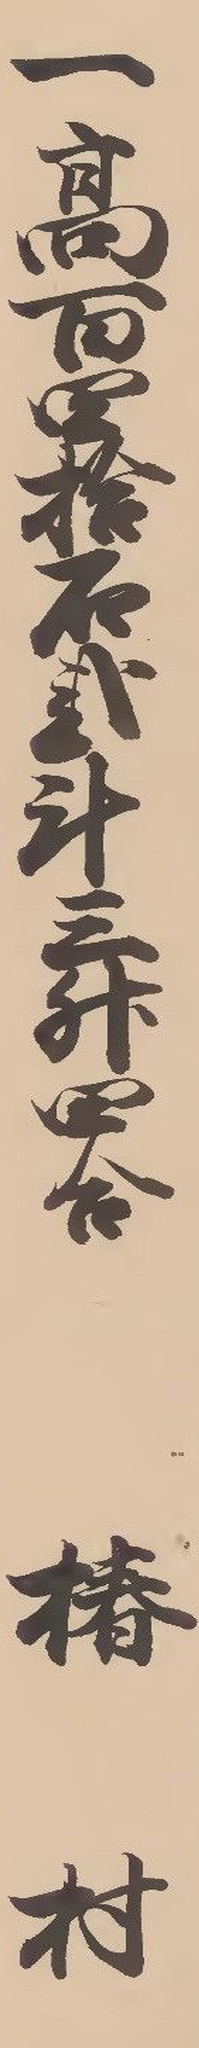一高百四拾石弐斗三升四合椿村
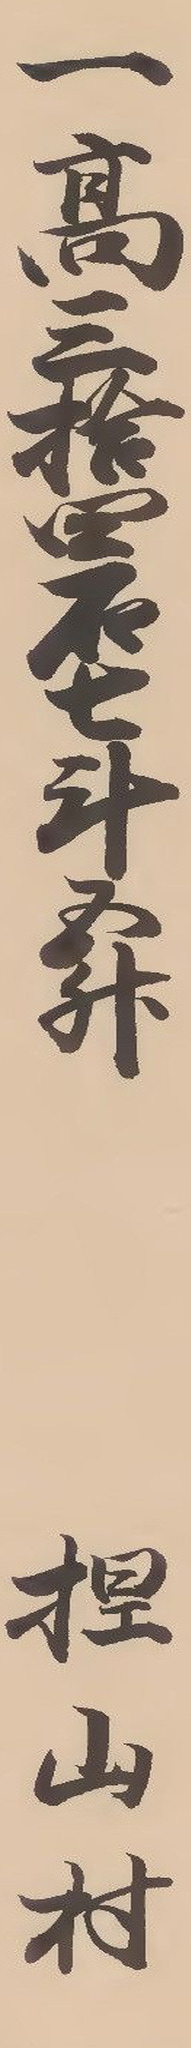一高三拾四石七斗五升捏山村
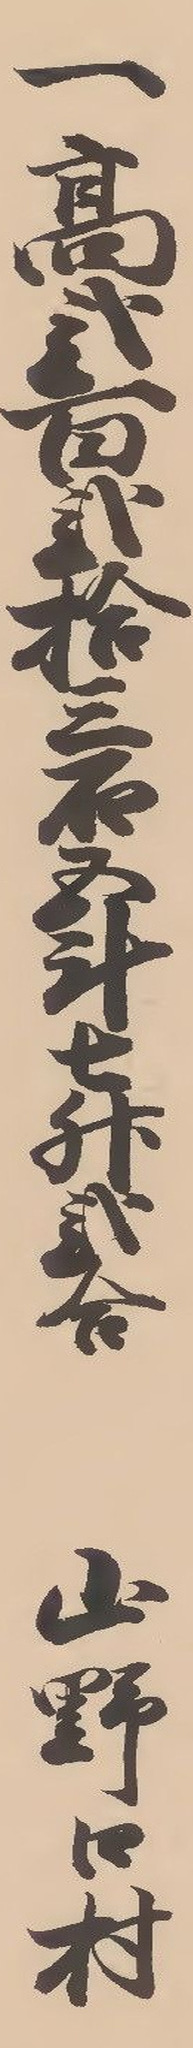一高弐百弐拾三石五斗七升弐合山野口村
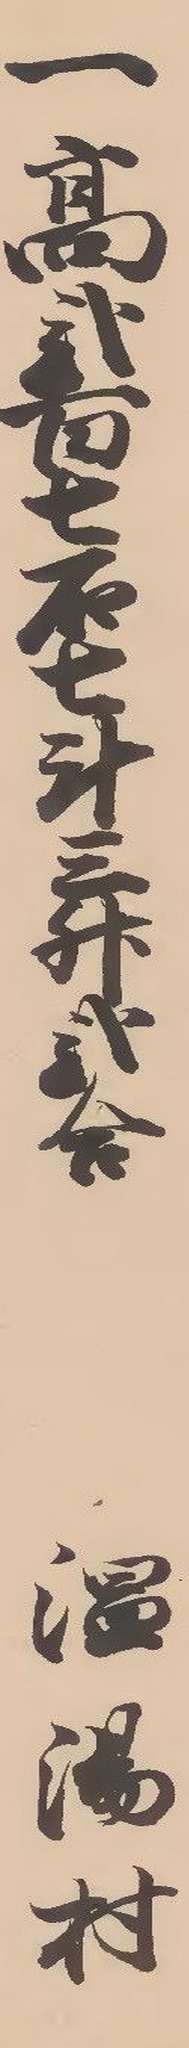一高弐百七石七斗三升弐合温湯村

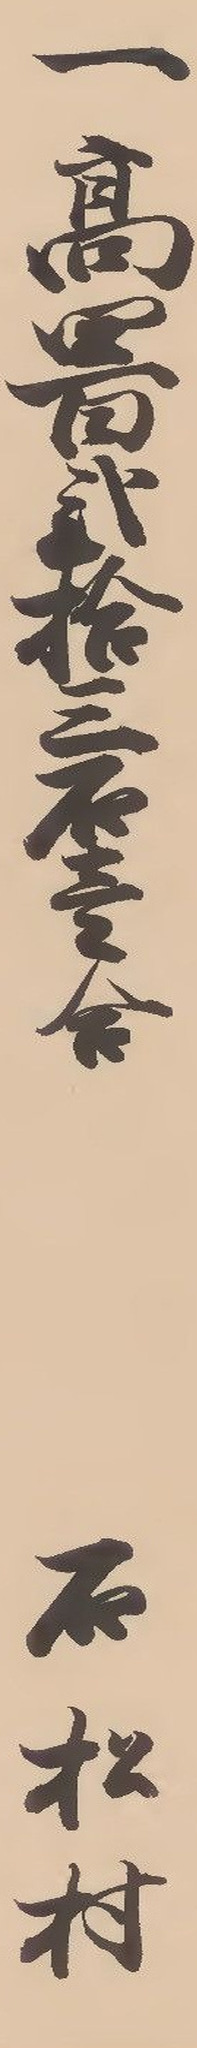一高四百弐拾三石壱合石松村
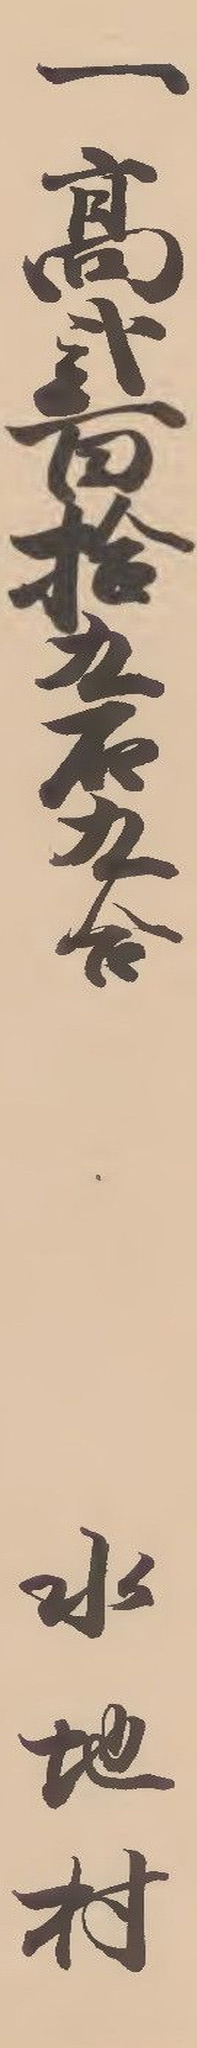一高弐百拾九石九合水地村
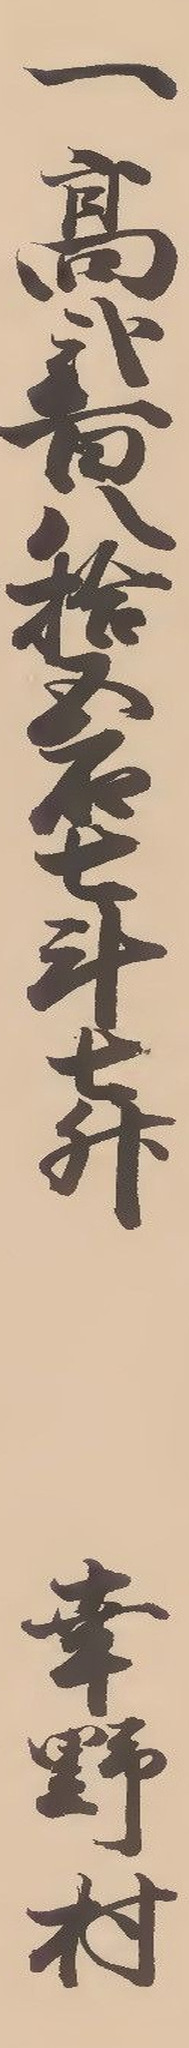一高弐百八拾五石七斗七升幸野村
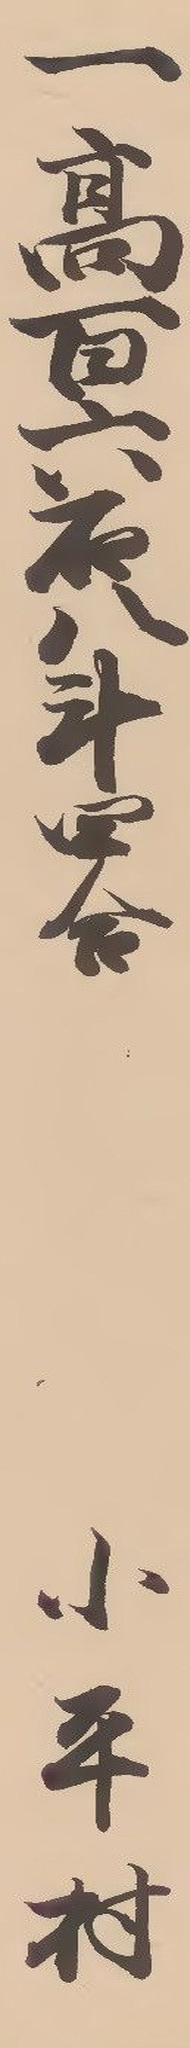一高百六石八斗四合小平村
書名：豊後国郷帳
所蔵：国立公文書館 National Archives of Japan
